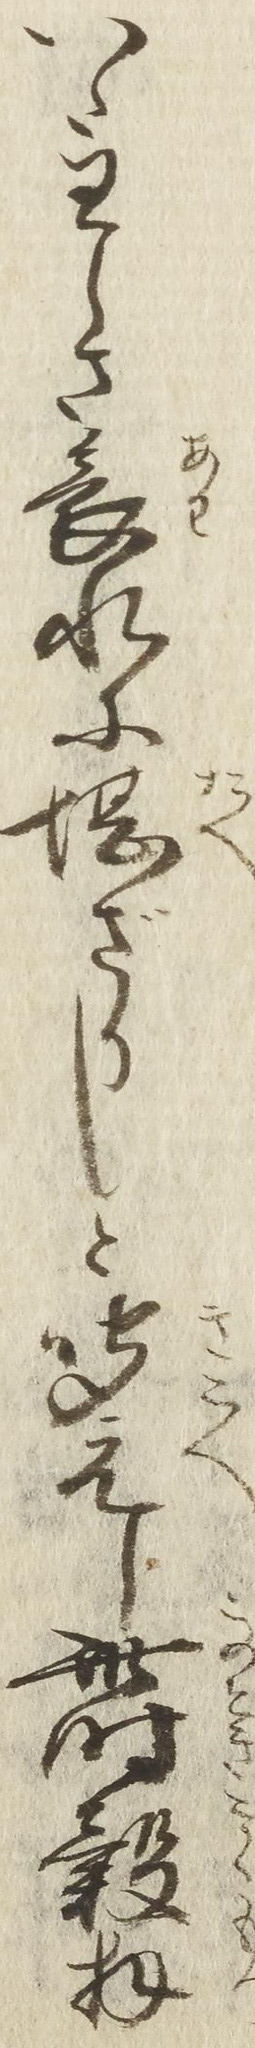いたわしさ哀れに堪ざりしと聞えし此時穀物
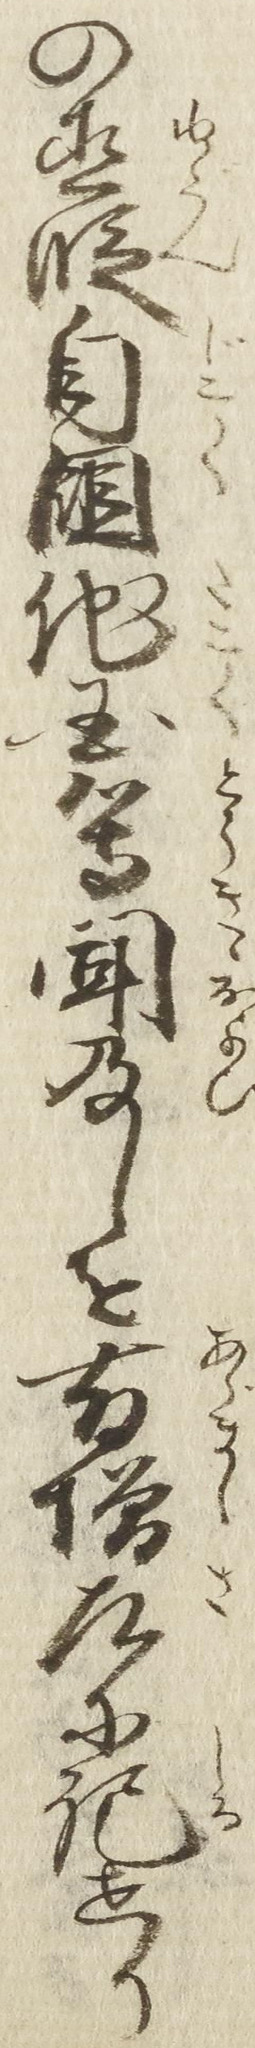の直段自国他国等聞及しを有増左に記せり
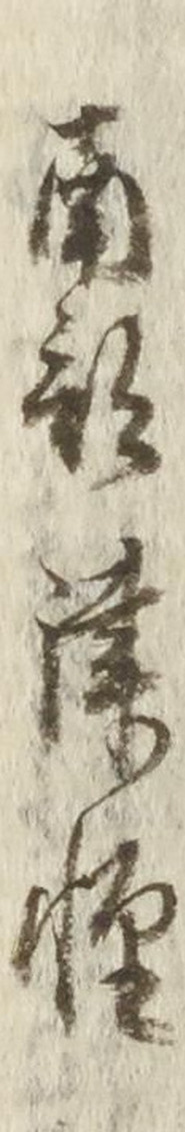南部津軽
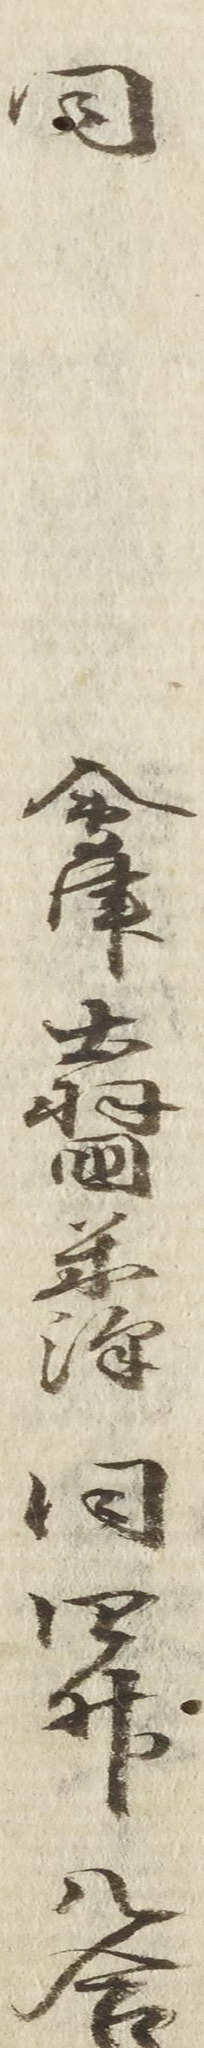同會津出羽邦米津同四升八合
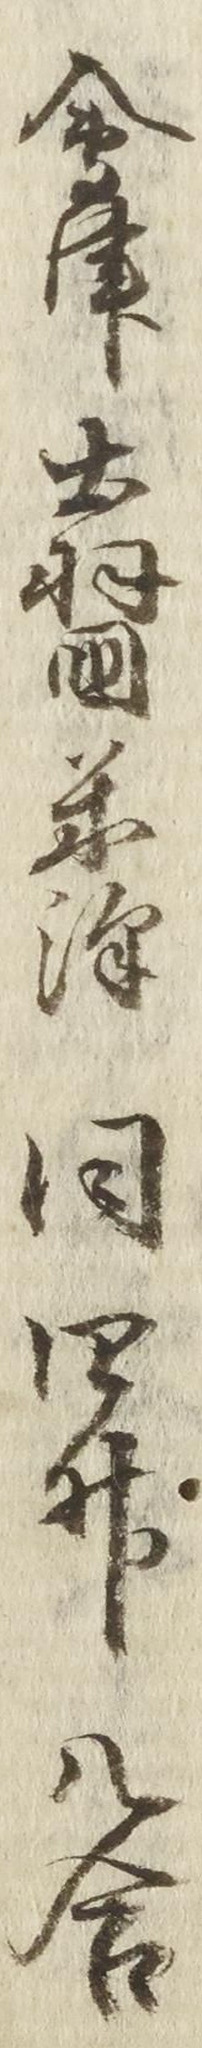同會津出羽邦米津同四升八合
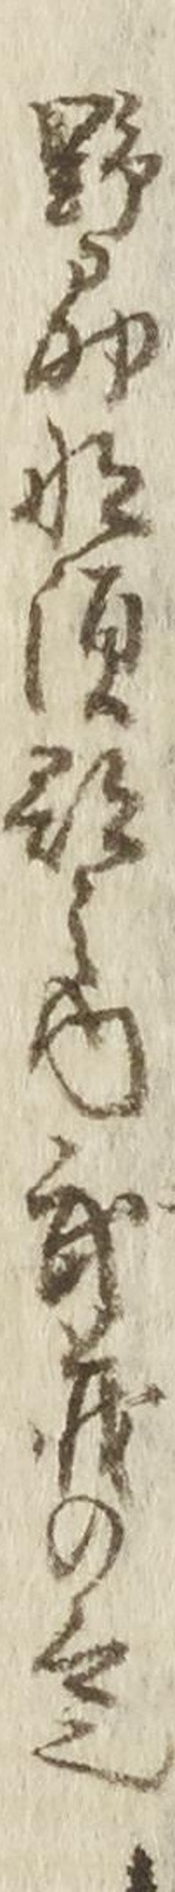野州那須郡之内武茂の郷也

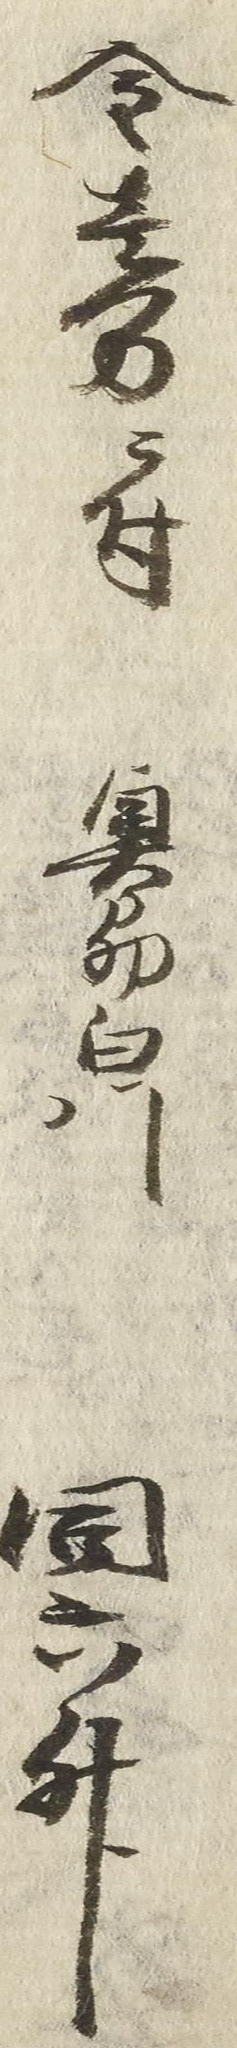金壱分ニ付奥州白川同六升
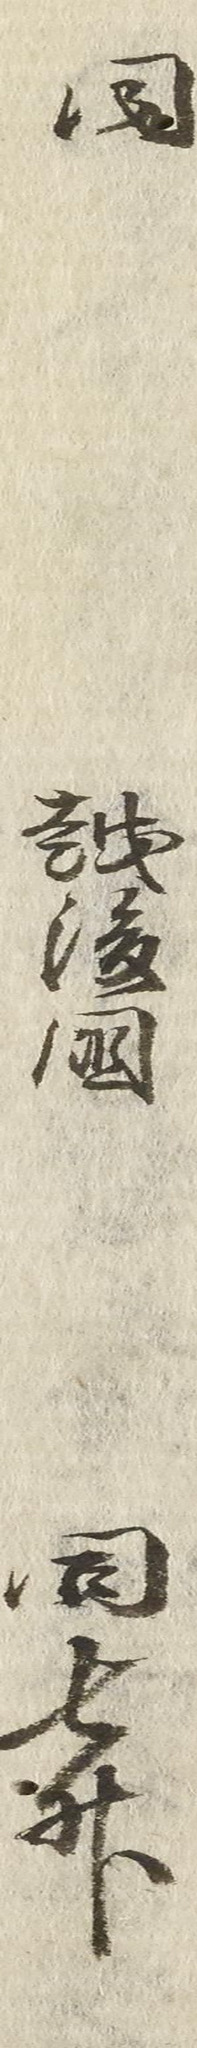同越後国同七升
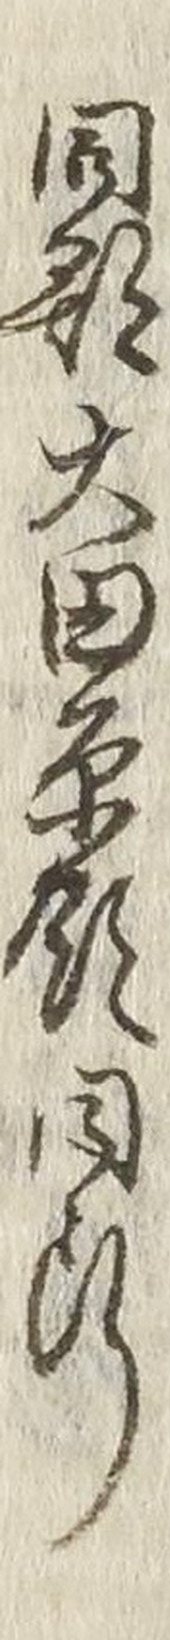同郡大田原領同断
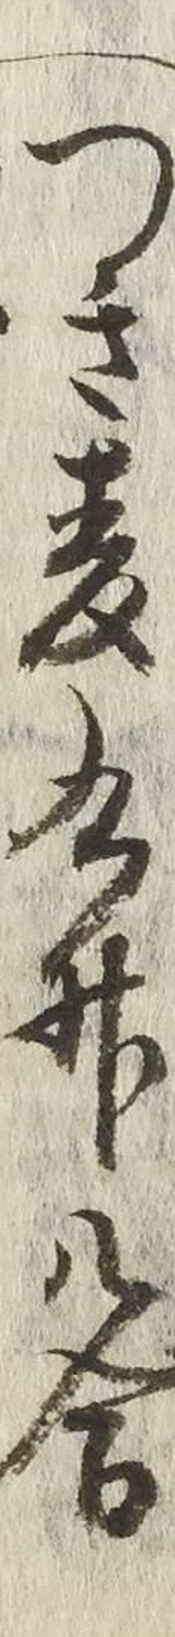つき麦九升八合
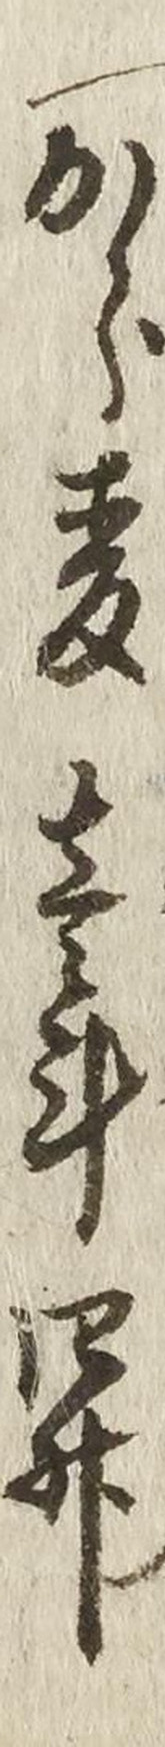から麦壱斗四升
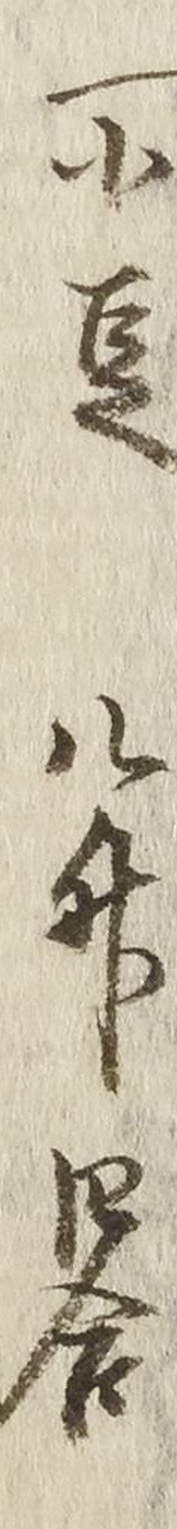小豆八升四合
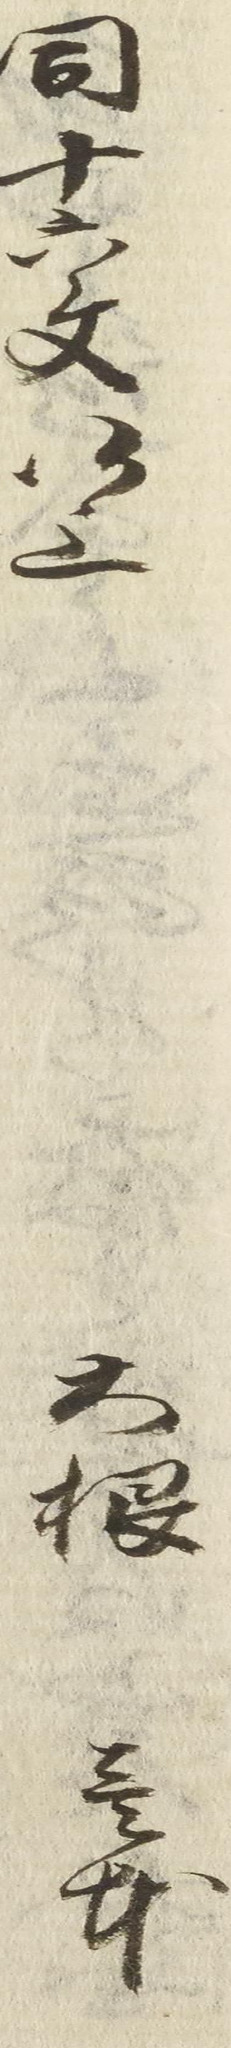同十六文以上大根壱本
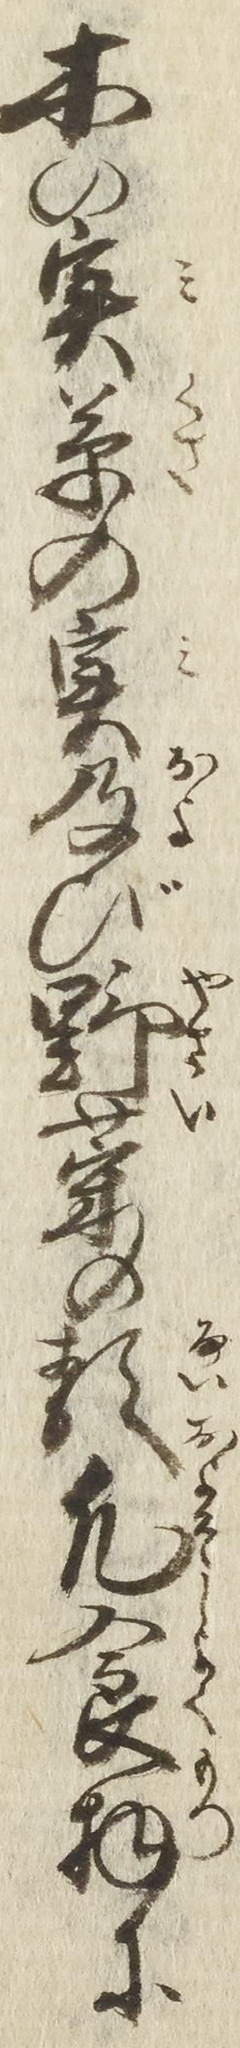木の実草の実及び野菜の類凡食物に
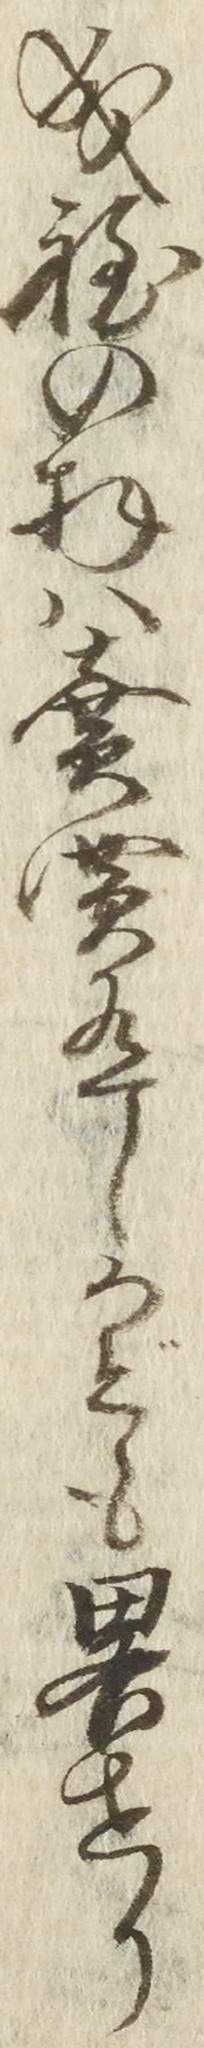成程の物は売買有しかども略せり
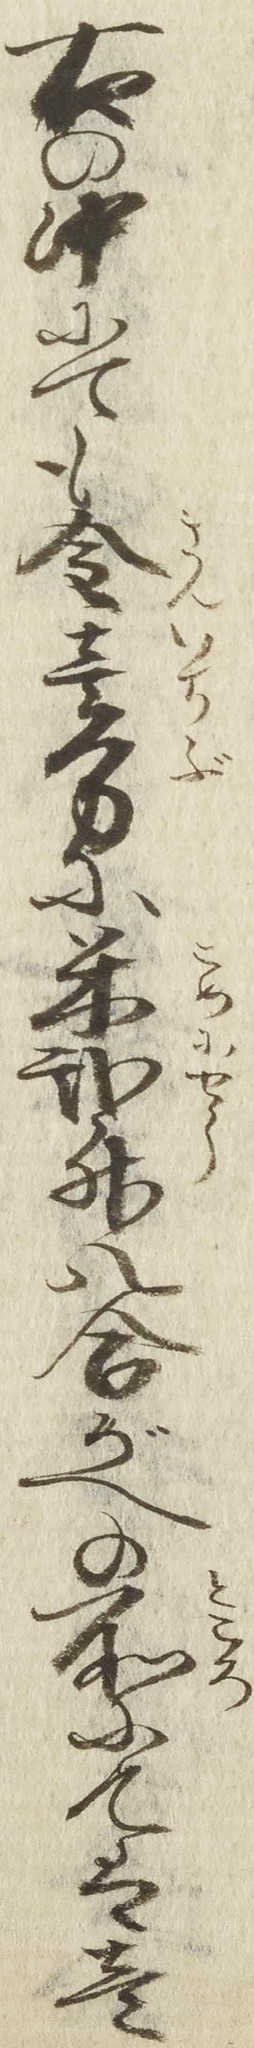右の中にても金壱分に米弐升八合がへの所にては壱
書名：天明奇畧　全
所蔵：東京大学地震研究所図書室 Earthquake Research Institute Library, The University of Tokyo, JAPAN
